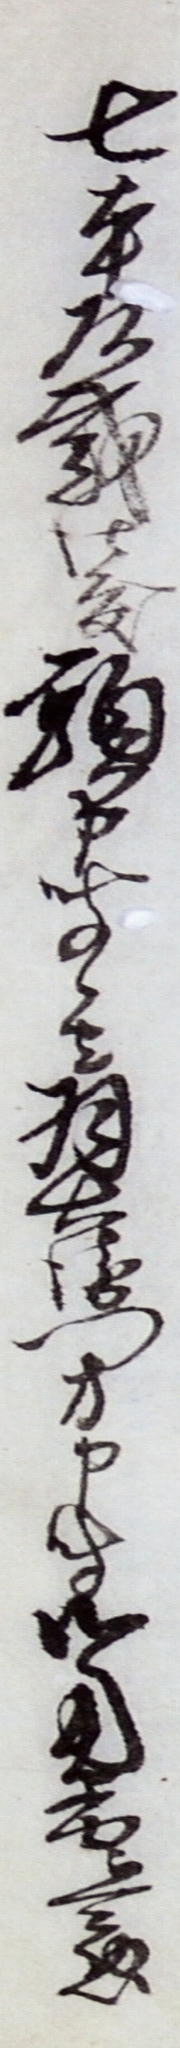七本頂戴仕度願申聞候羽右衛門方申付御用番迄惣

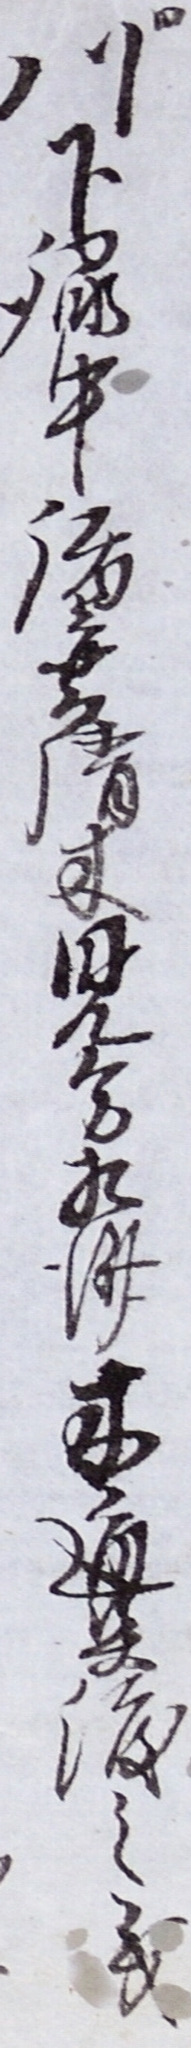一川下郷中諸普請木見分相済木之通達渡之義
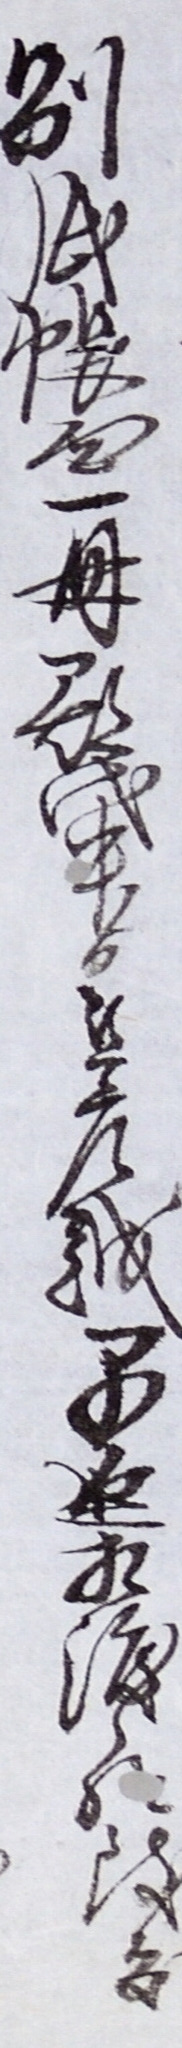別紙帳面一冊郡代中より被差越早速相渡候様致度
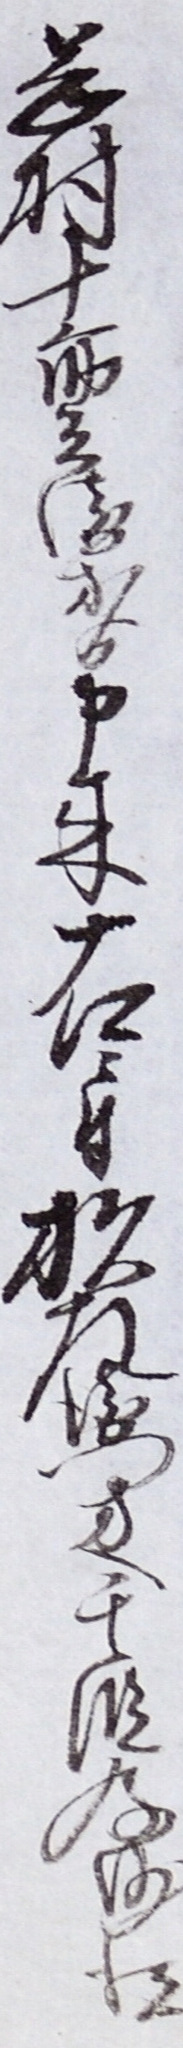岡村十郎兵衛殿より申来右ニ付杉左衛門方へ其段及沙汰
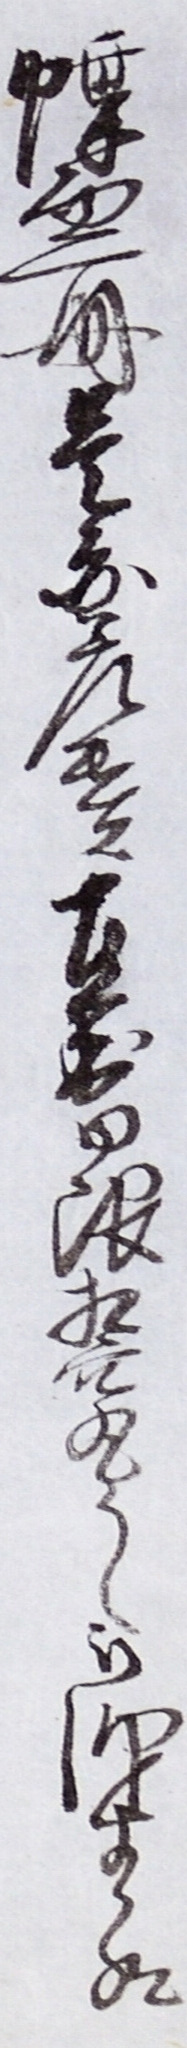帳面二冊是亦差遣ス本番日限相せゆらし被仰付候様
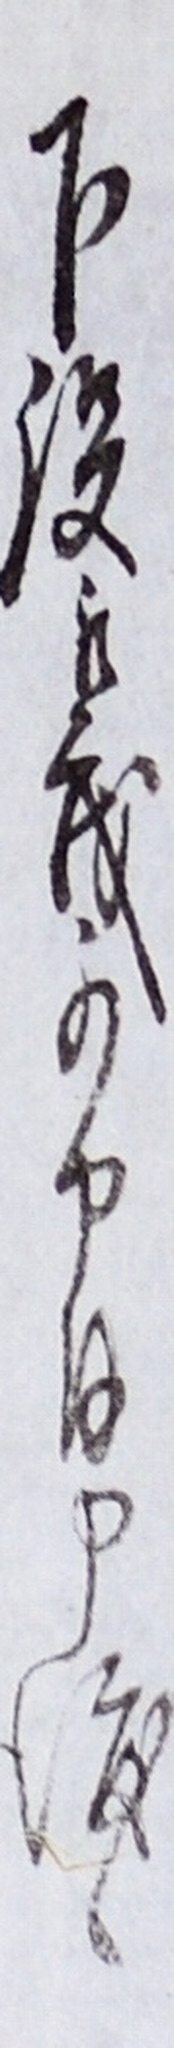下役江も可申付申渡候
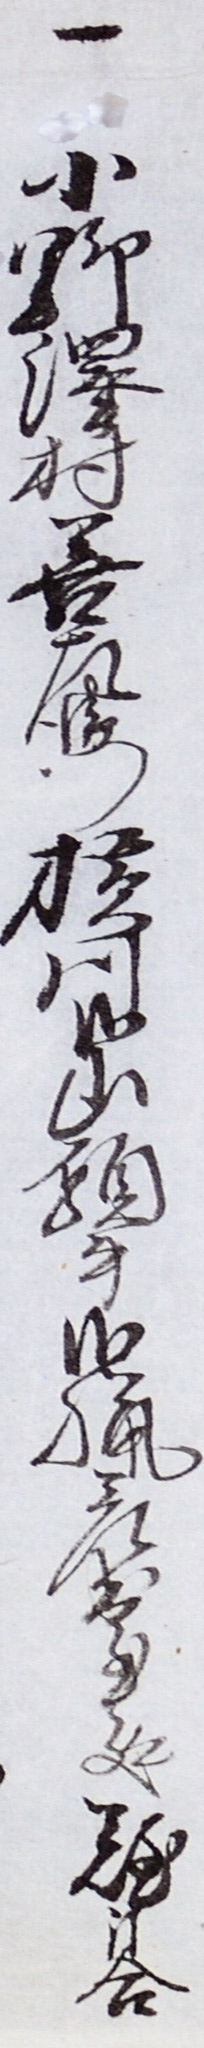一小野澤村善左衛門横川山願年御猟差出来処難引合
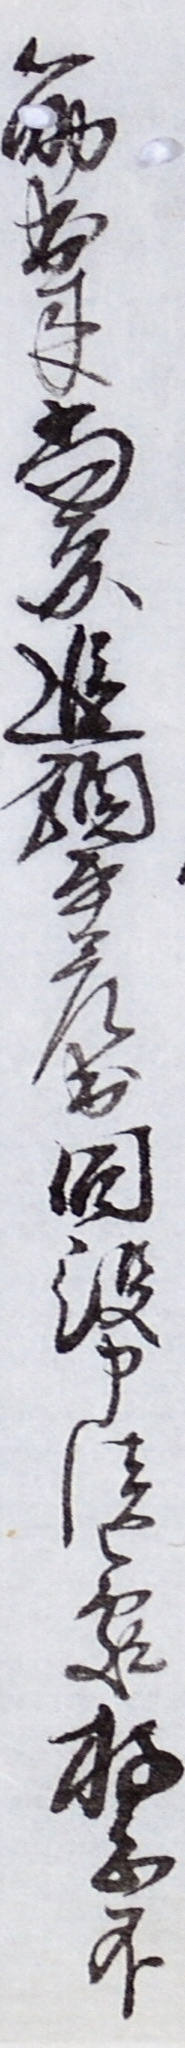筋出来当夏追願書差出同役申談候処林五外
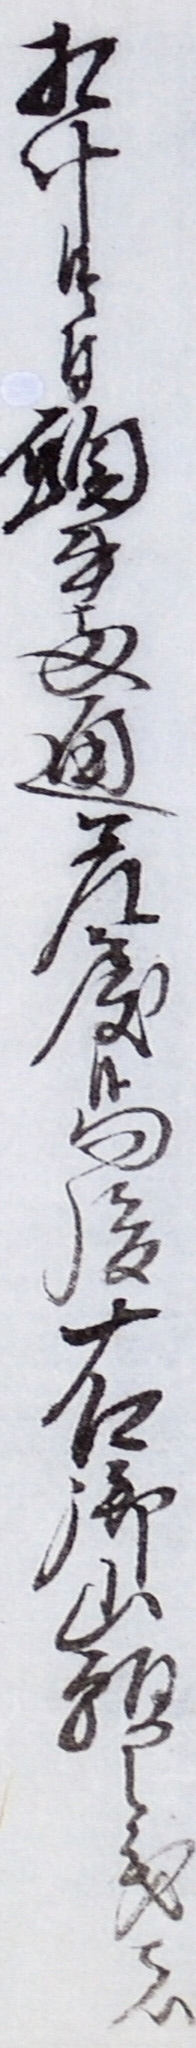相計候ニ付願書両通差戻候向後右払山願之義を以上
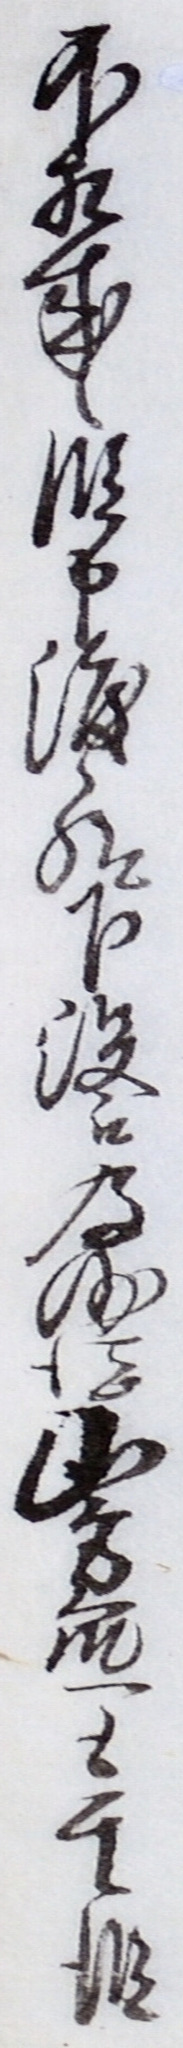不相成候段申渡候様下約被及沙汰山方衆へも其段
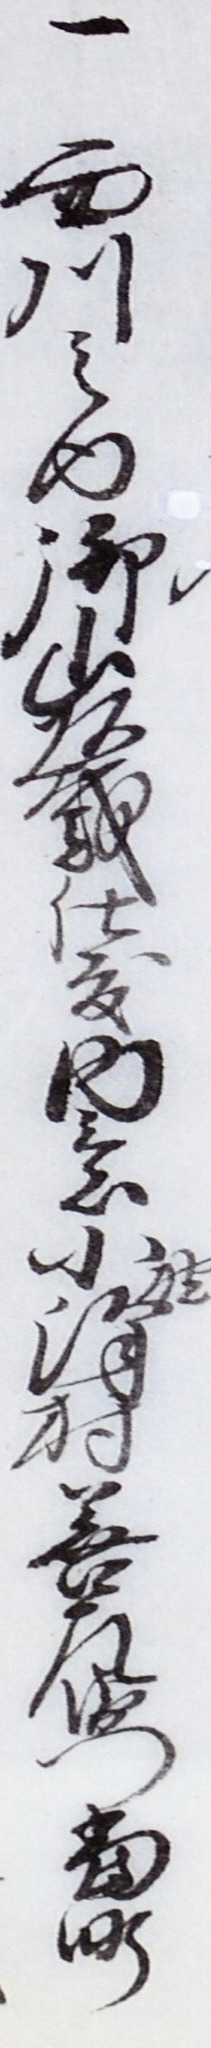一西川之内御山頂戴仕度内意小沢村善左衛門当町
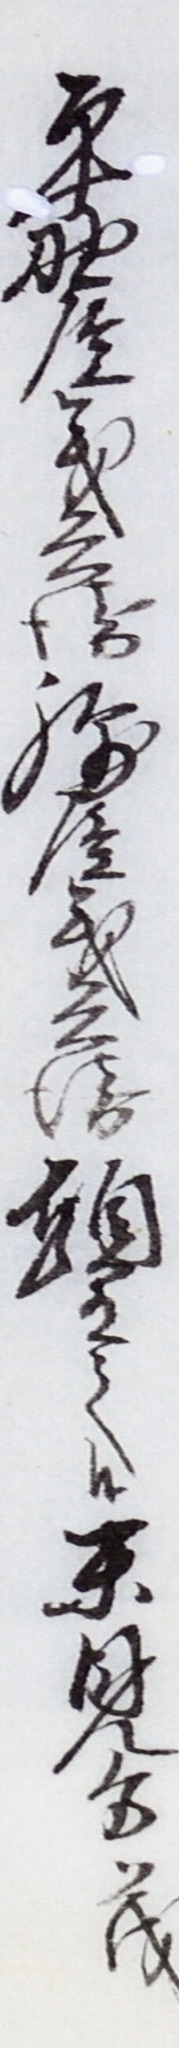平野屋義兵衛綿屋義兵衛願有之候未見分義
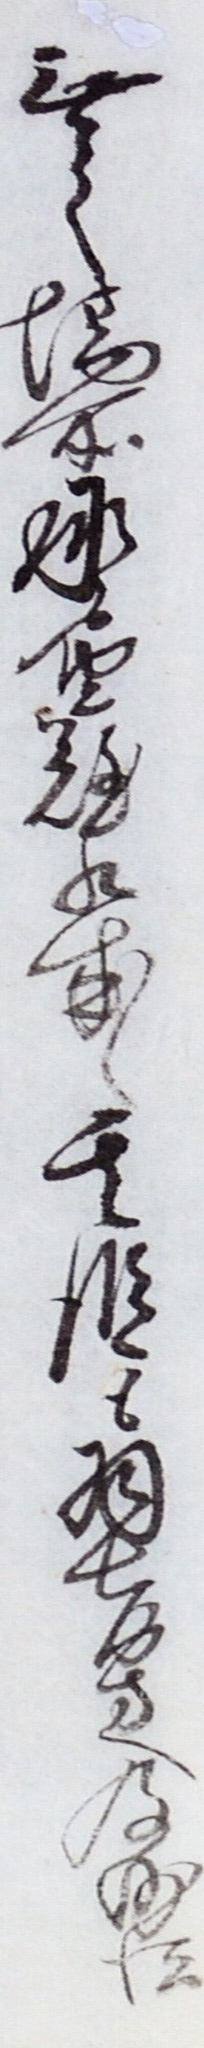無之場所非届難相成候其段も羽右衛門方及沙汰
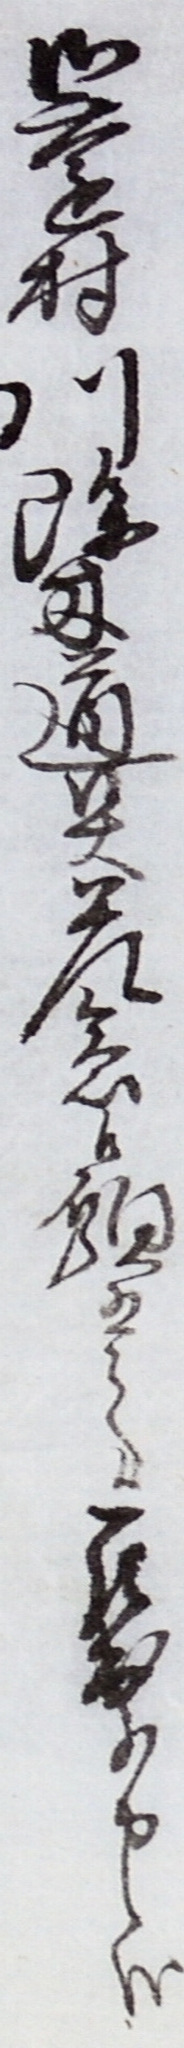御薗村川除木道具差急被願書有之罷出可申候
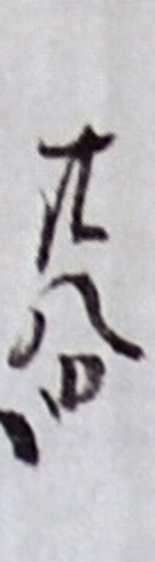廿八日
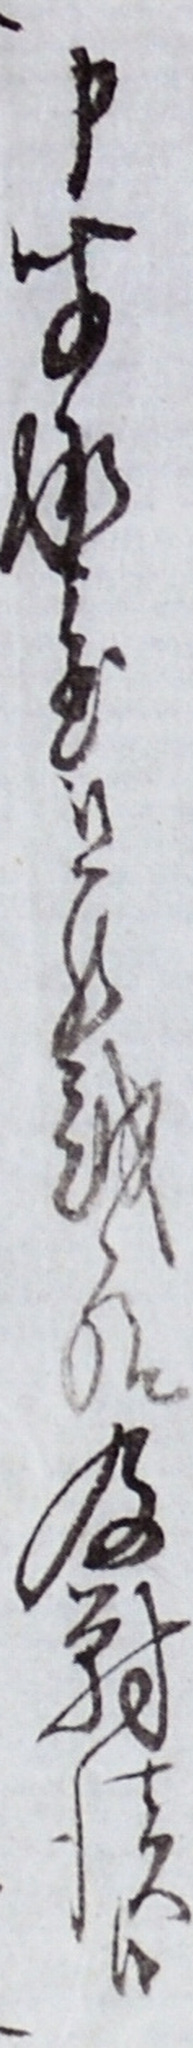申聞承置被罷越候様及沙汰
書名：御山奉行御用控
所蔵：伊那市立高遠町図書館・合同会社AMANE
